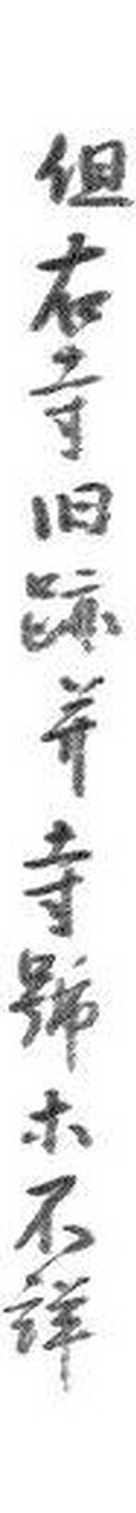但右寺旧跡并寺号等不詳
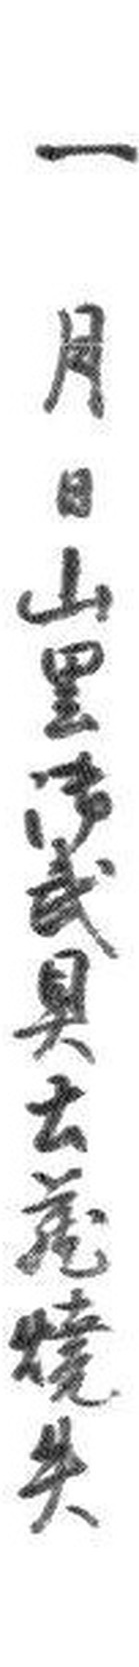一月日山里御武具土蔵焼失
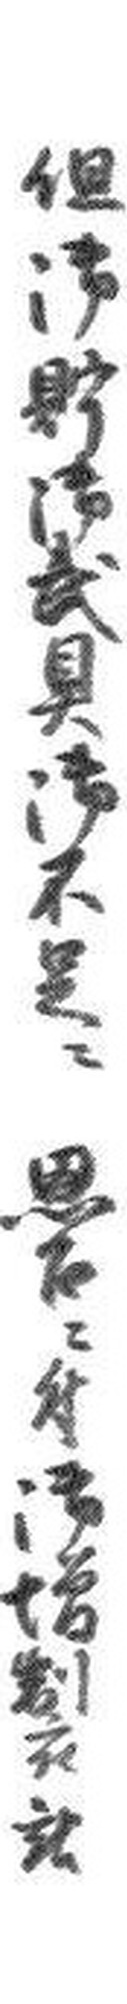但御貯御武具御不足ニ思召ニ付御増製被
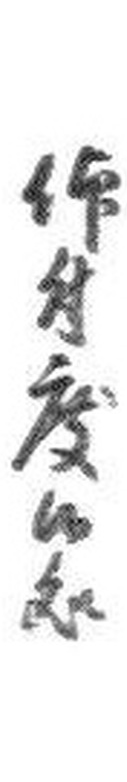仰付度候処

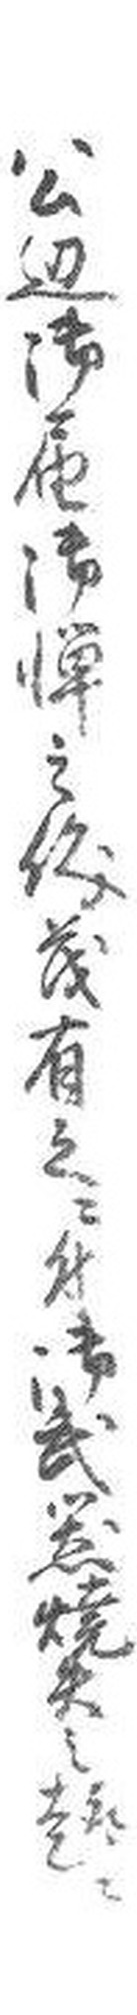公辺御届御憚之儀も有之ニ付御武器焼失之趣ニ
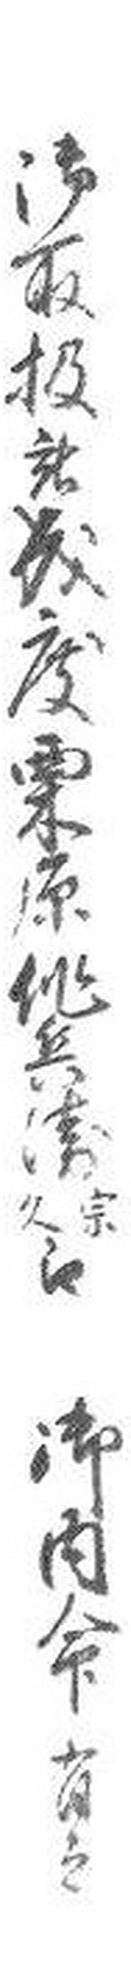御取扱被成度栗原作兵衛宗久江御内命有之
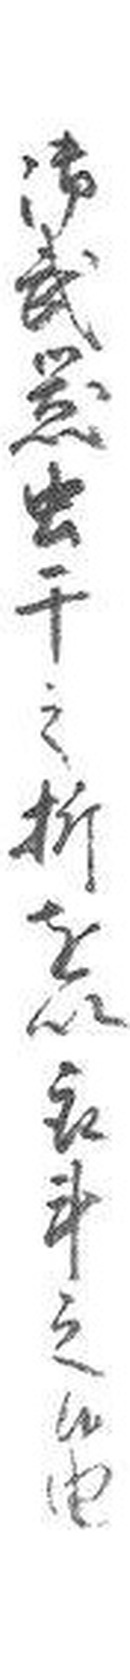御武器虫干之折を以取斗之候由
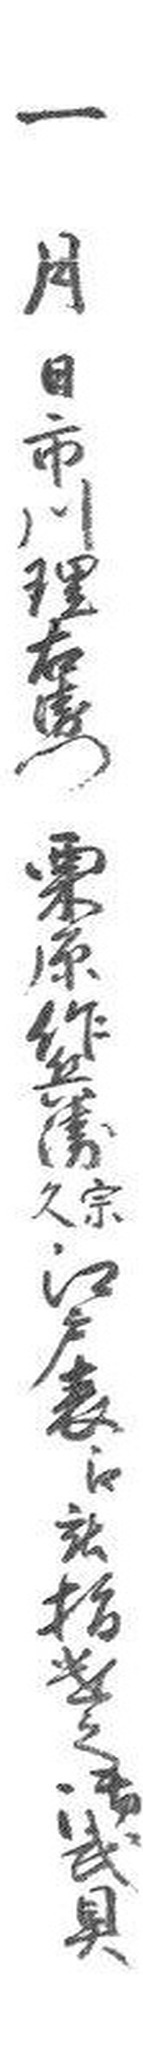一月日市川理右衛門栗原作兵衛宗久江戸表江被指遣之御武具
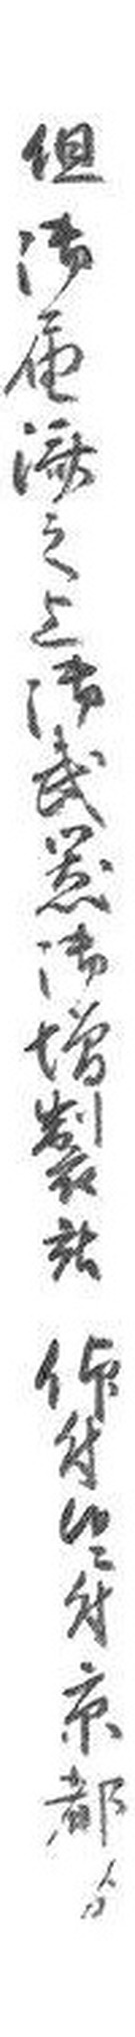但御届済之上御武器御増製被仰付候ニ付京都ゟ
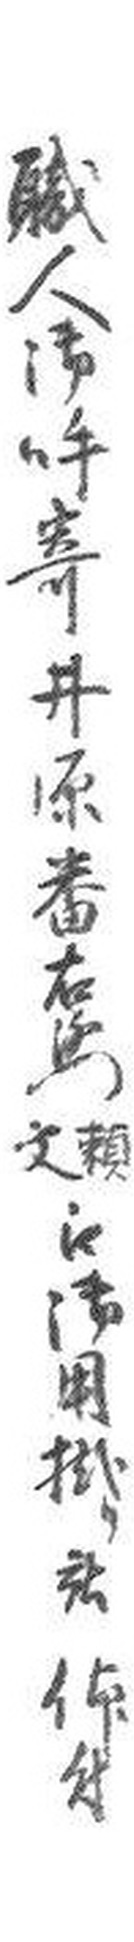職人御呼寄井原番右衛門頼文江御用掛リ被仰付
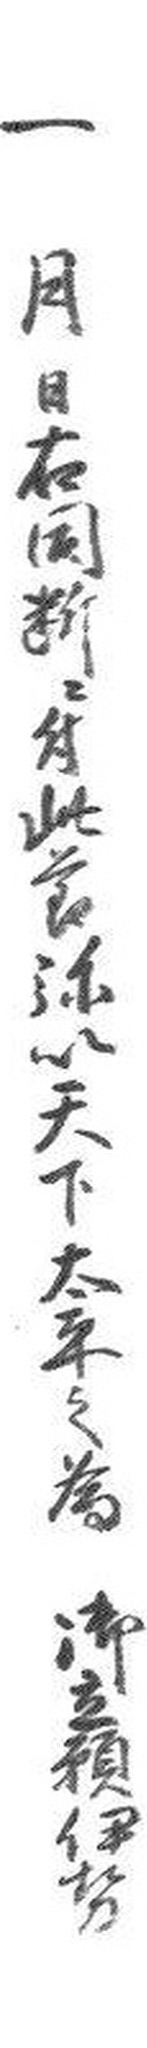一月日右同断ニ付此節弥以天下太平之為御立願伊勢
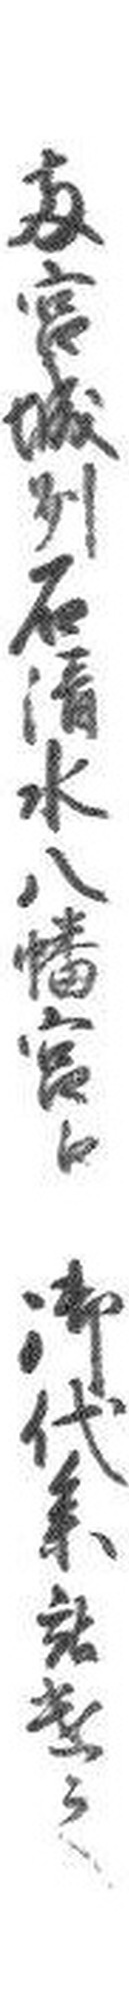両宮城州石清水八幡宮江御代参被遣之
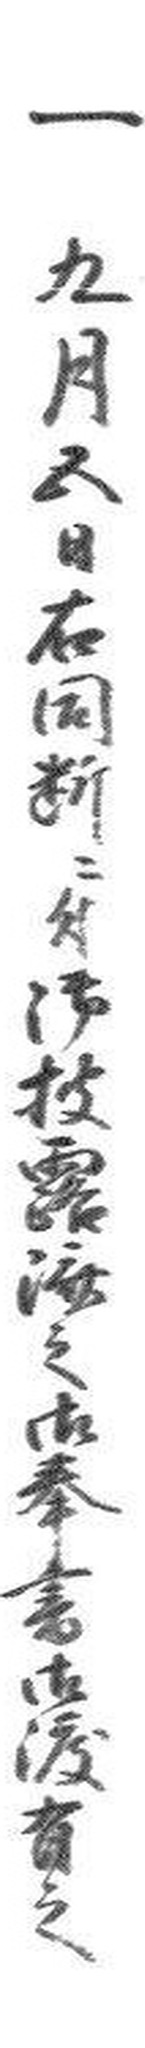一九月五日右同断ニ付御披露済之御奉書御渡有之
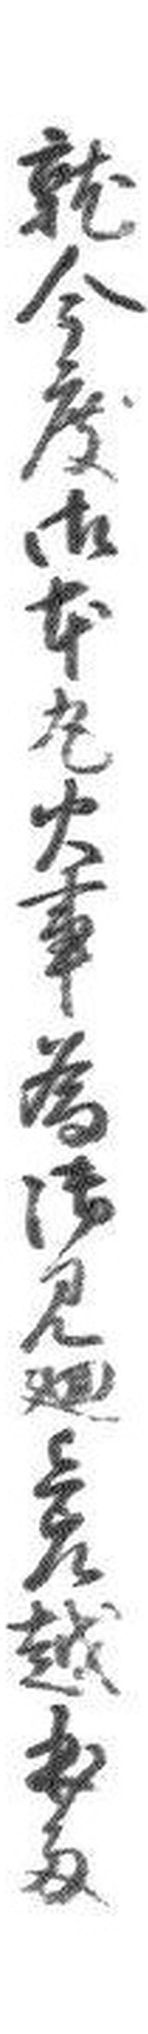就今度御本丸火事為御見廻被差越本多
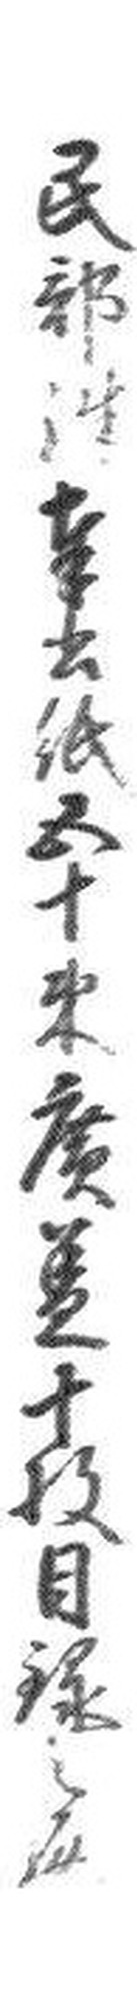民部殊奉書紙五十束広蓋十枚目録之通
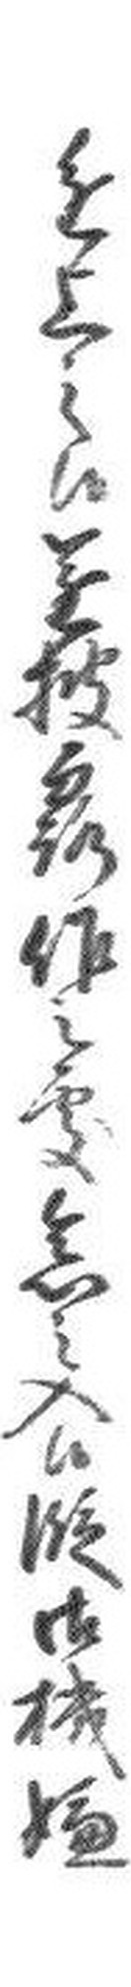進上之候遂披露候之処念之入候段御機嫌
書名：家譜 四 忠昌公 従寛永七年到正保四年
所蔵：福井県文書館 Fukui Prefectural Archives
